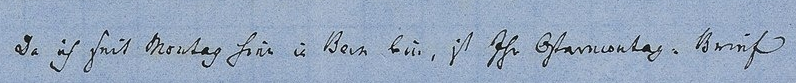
Da ich seit Montag hier in Bern bin, ist Ihr Ostermontag-Brief
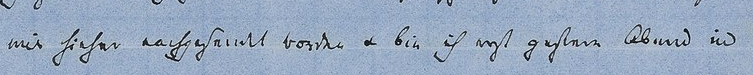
mir hieher nachgesendet worden & bin ich erst gestern Abend in
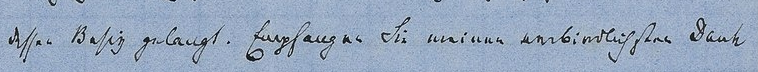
dessen Besitz gelangt. Empfangen Sie meinen verbindlichsten Dank
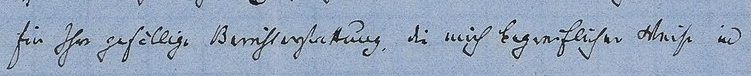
für Ihre gefällige Berichterstattung, die mich begreiflicher Weise in
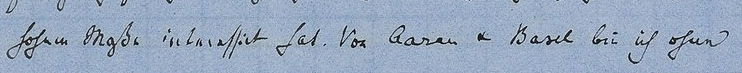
hohem Maße interessirt hat. Von Aarau & Basel bin ich ohne
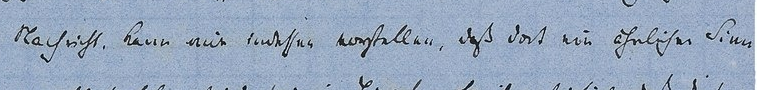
Nachricht, kann mir indessen vorstellen, daß dort ein ähnlicher Sinn
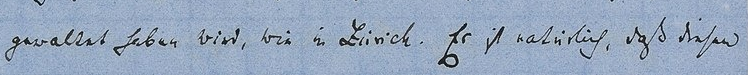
gewaltet haben wird, wie in Zürich. Es ist natürlich, daß diesen
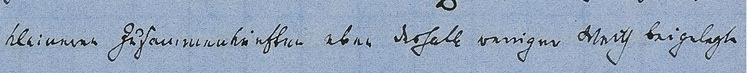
kleineren Zusammenkünften eben deshalb weniger Werth beigelegte
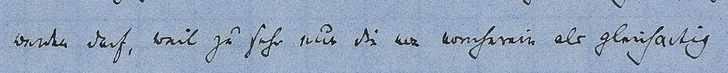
werden darf, weil zu sehr nur die von vornherein als gleichartig
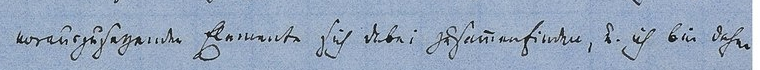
vorauszusetzenden Elemente sich dabei zusammenfinden, u. ich bin daher
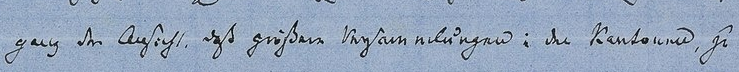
ganz der Ansicht, daß größere Versammlungen in den Kantonen, zu
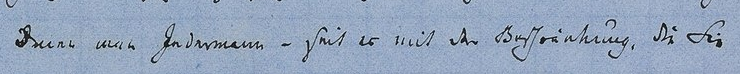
denen man Jedermann – seit es mit der Beschränkung, die Sie
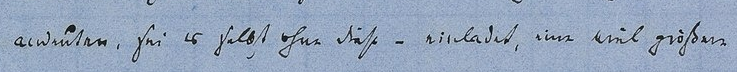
andeuten, sei es selbst ohne diese – einladet, eine viel größere
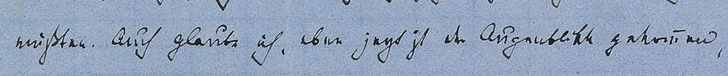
müßten. Auch glaube ich, eben jetzt ist der Augenblikk gekommen,
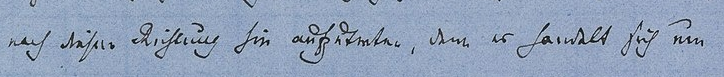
nach dieser Richtung hin aufzutreten, denn es handelt sich um
